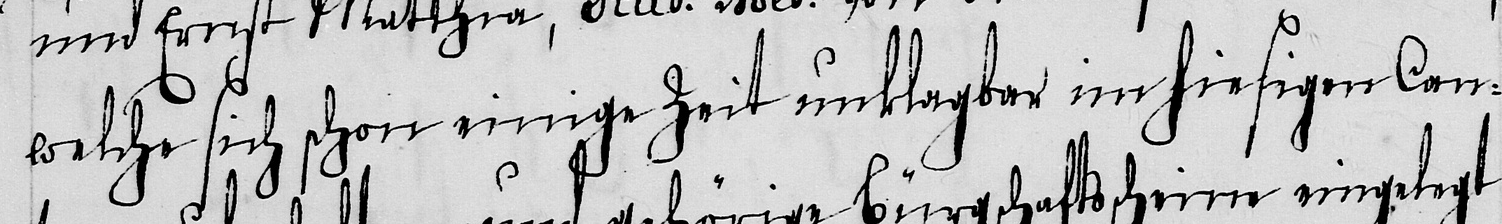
welche sich schon einige Zeit unklagbar im hiesigen Can¬
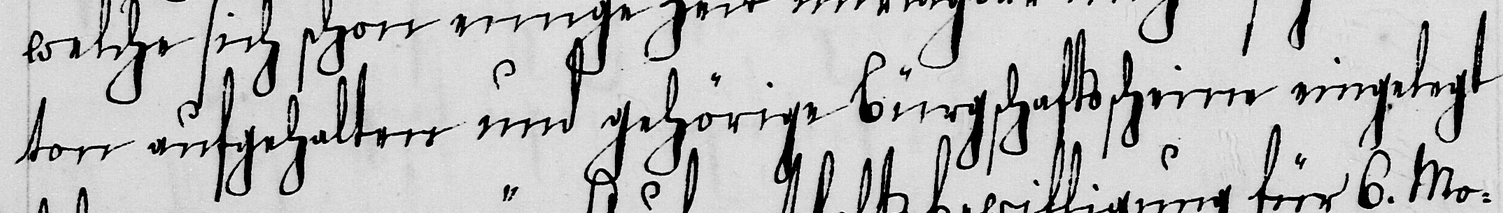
ton aufgehalten und gehörige Bürgschaftsscheine eingelegt
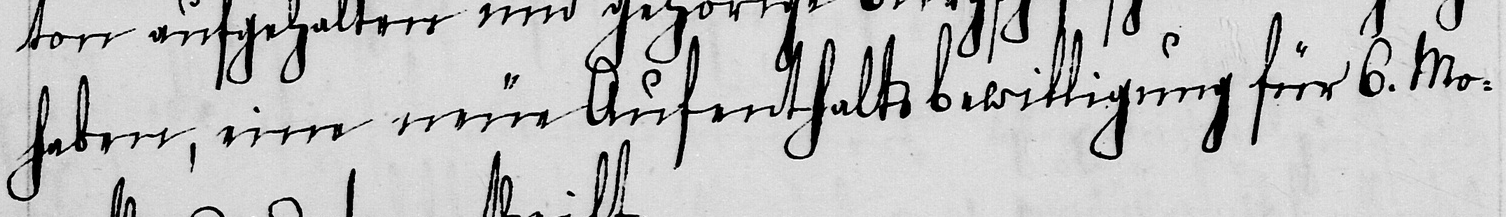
haben, eine neue Aufenthaltsbewilligung für 6. Mo¬
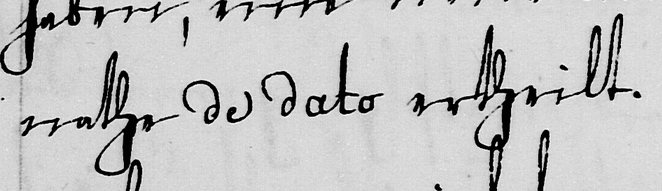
nathe de dato ertheilt.
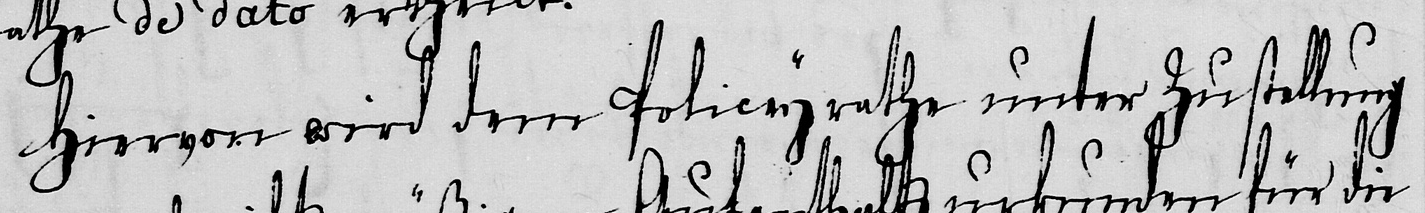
Hiervon wird dem Policeyrathe unter Zustellung
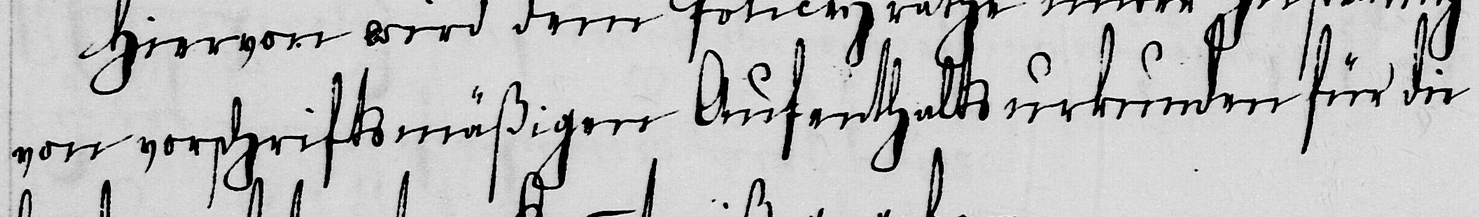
von vorschriftsmäßigen Aufenthaltsurkunden für die
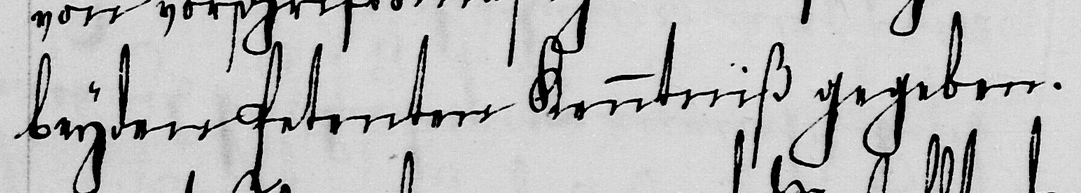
beyden Petenten Kenntniß gegeben.
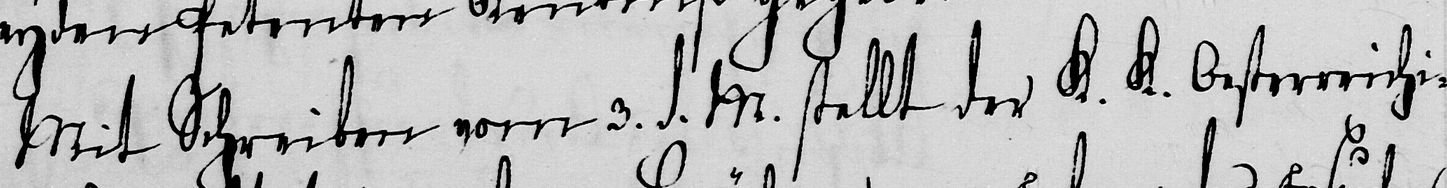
Mit Schreiben vom 3. d. M. stellt der K. K. Oesterreichi¬
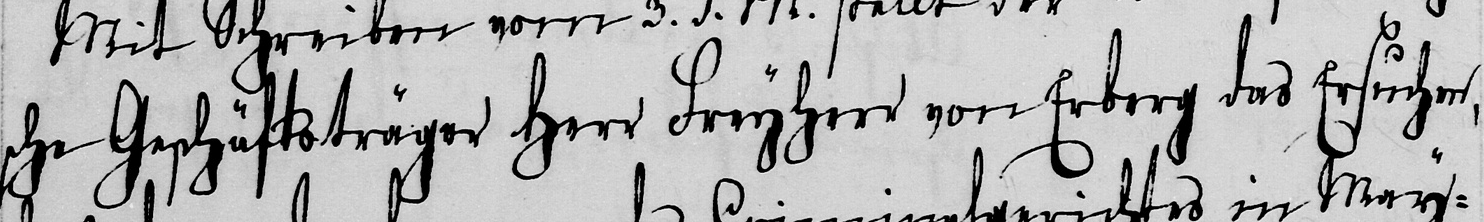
sche Geschäftsträger Herr Freyherr von Erberg das Ersuche¬
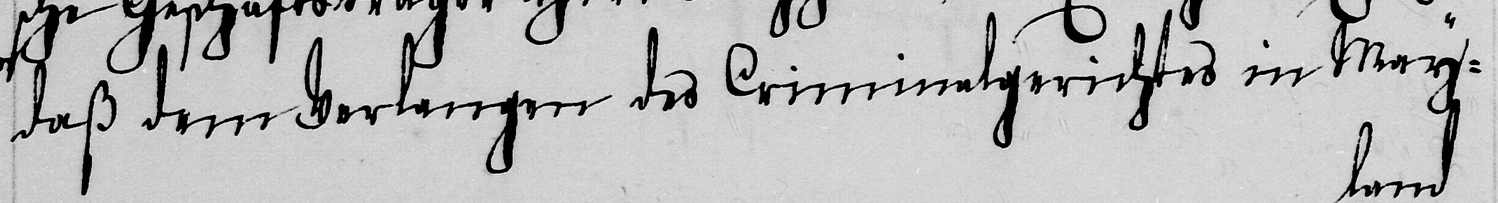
daß dem Verlangen des Criminalgerichtes in May-
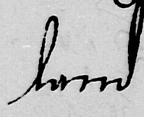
den
